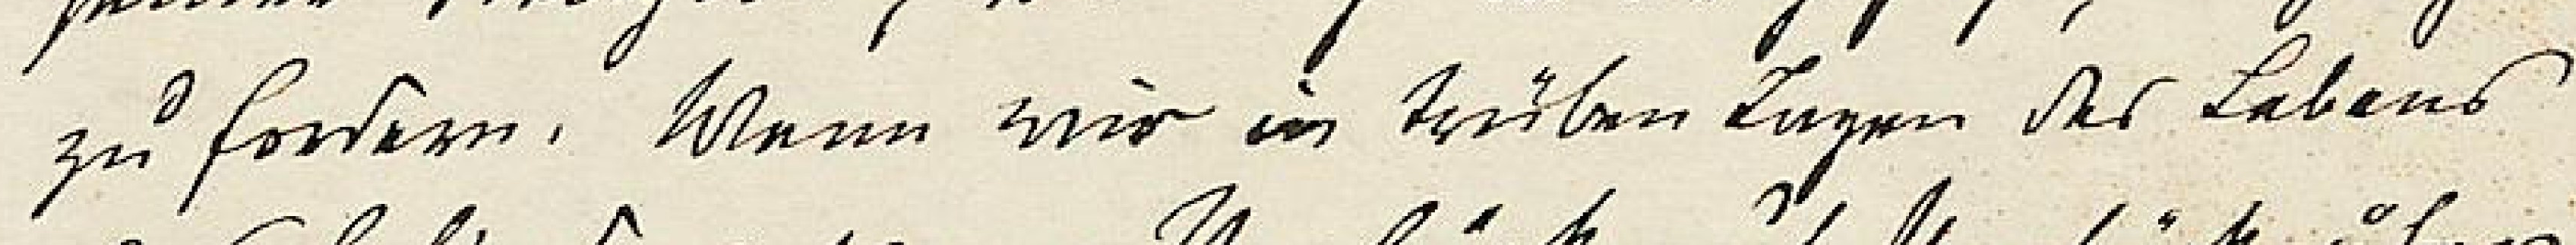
zu fordern. Wenn wir in trüben Langen des Lebens
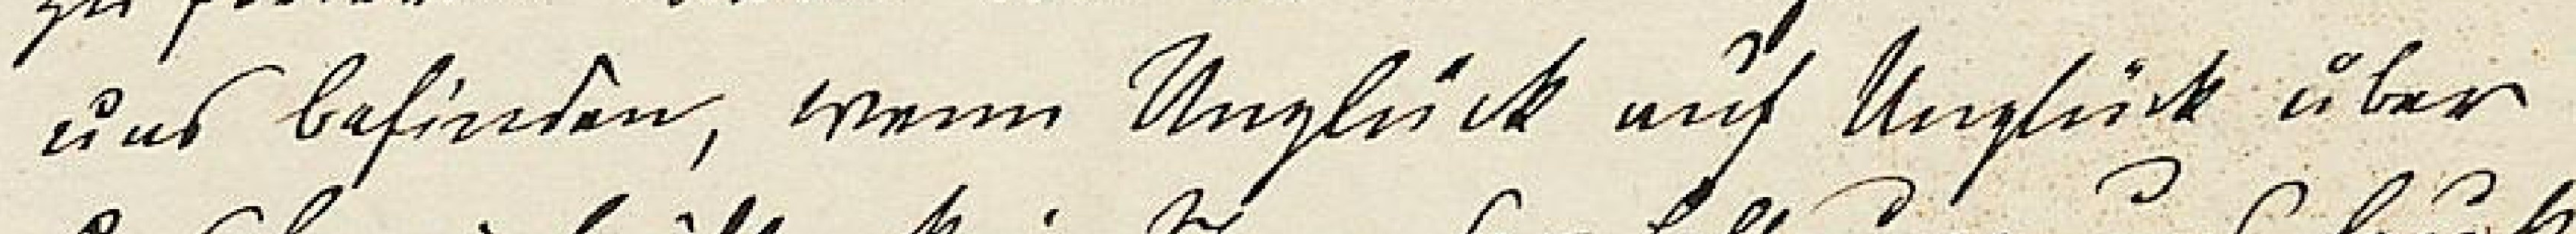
uns befinden, wenn Unglück auf Unglück über
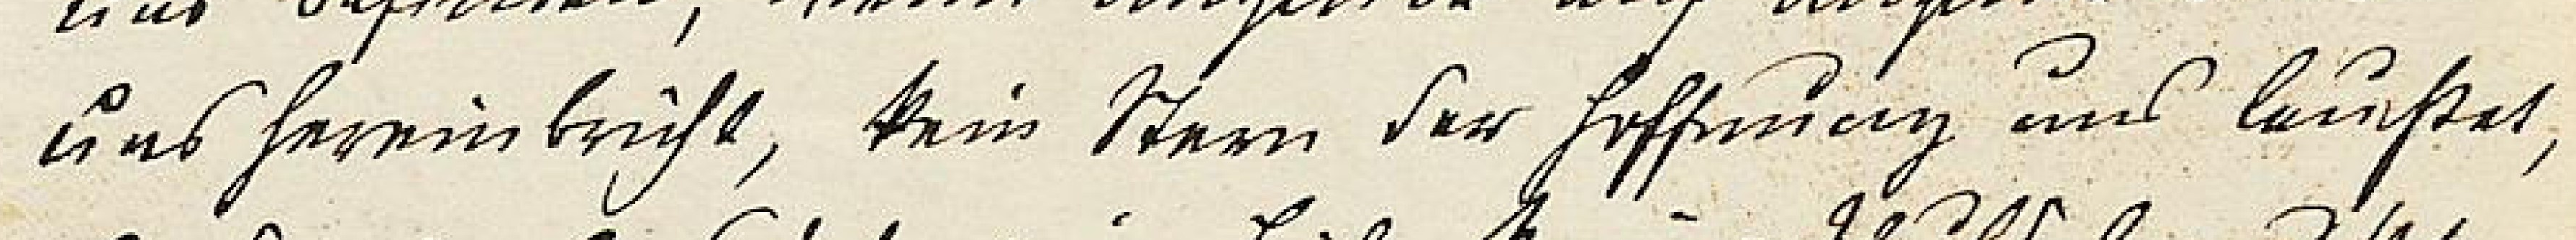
uns hereinbicht, kein Stern der Hoffnung uns leuchtet
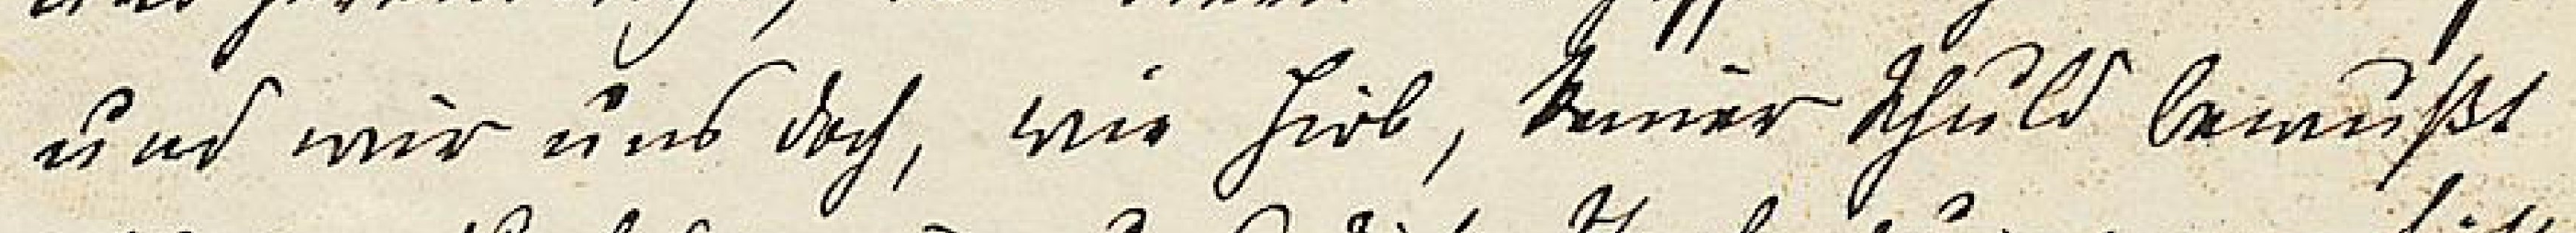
und wir uns doch, wie Hiob, keiner Schuld bewußt
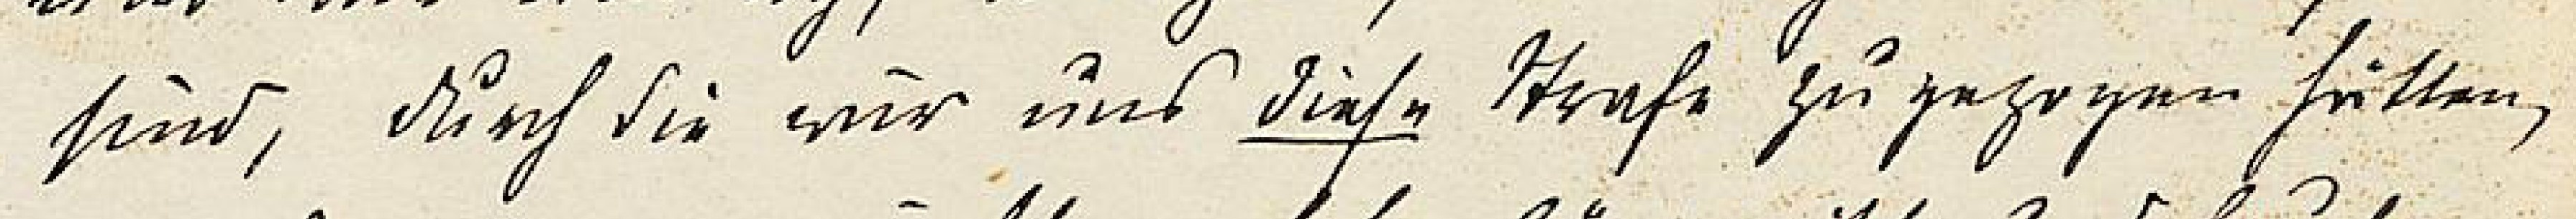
sind, durch die wir uns diese Strafe zugezogen hätten,
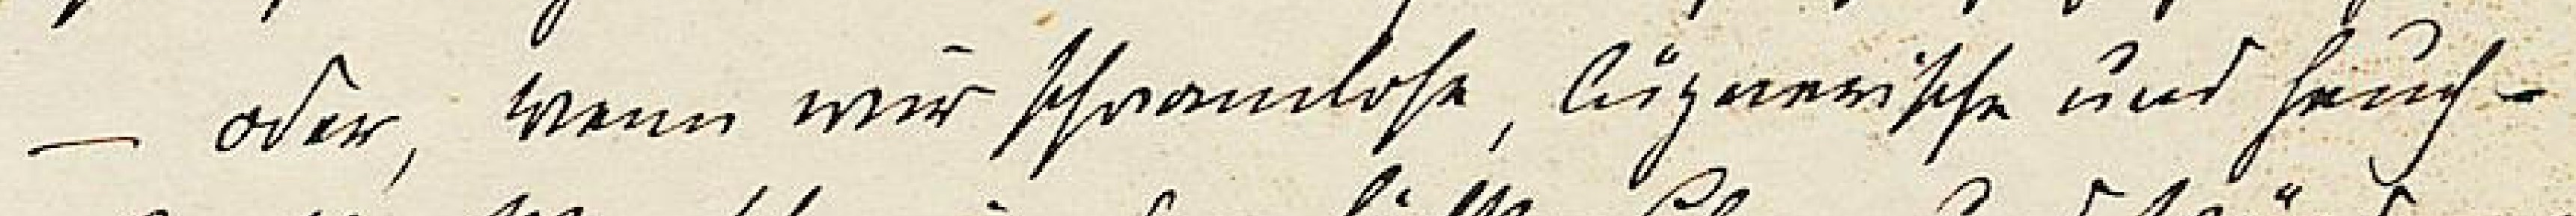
_ oder, wenn wir schamlose, lügnerische und heuch¬
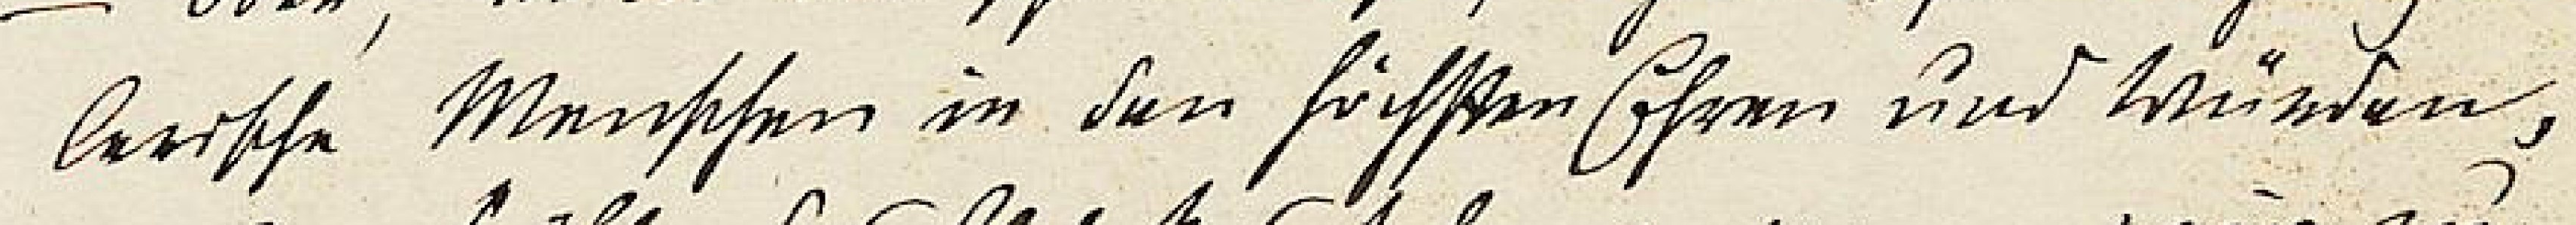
lerische Menschen in den höchsten Ehren und Würden,
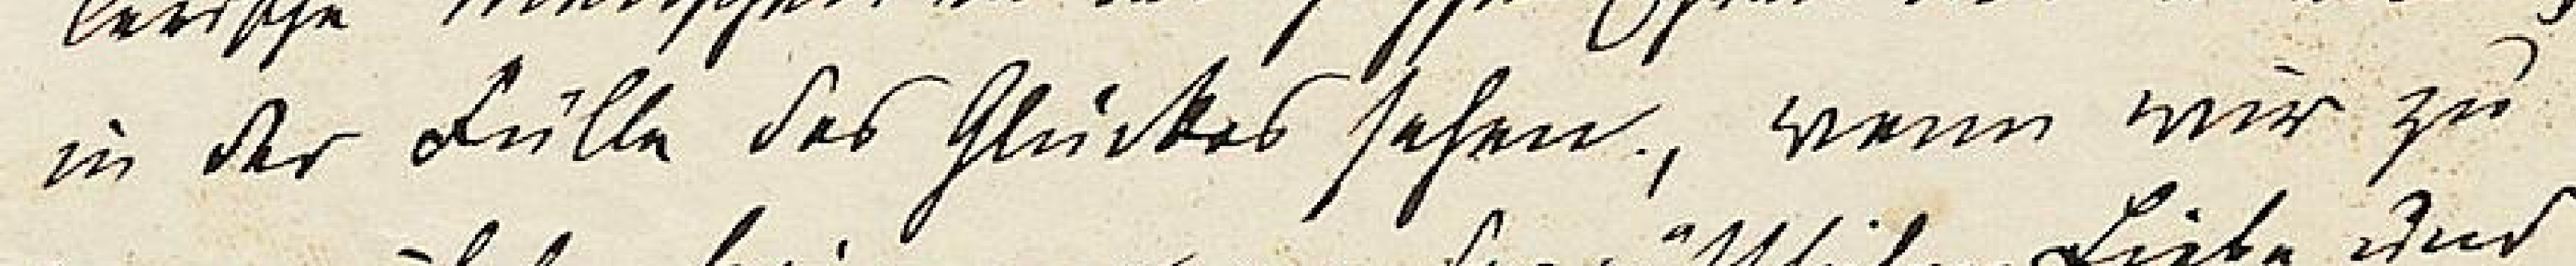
in der Fülle des Glückes sehen, wenn wir zu
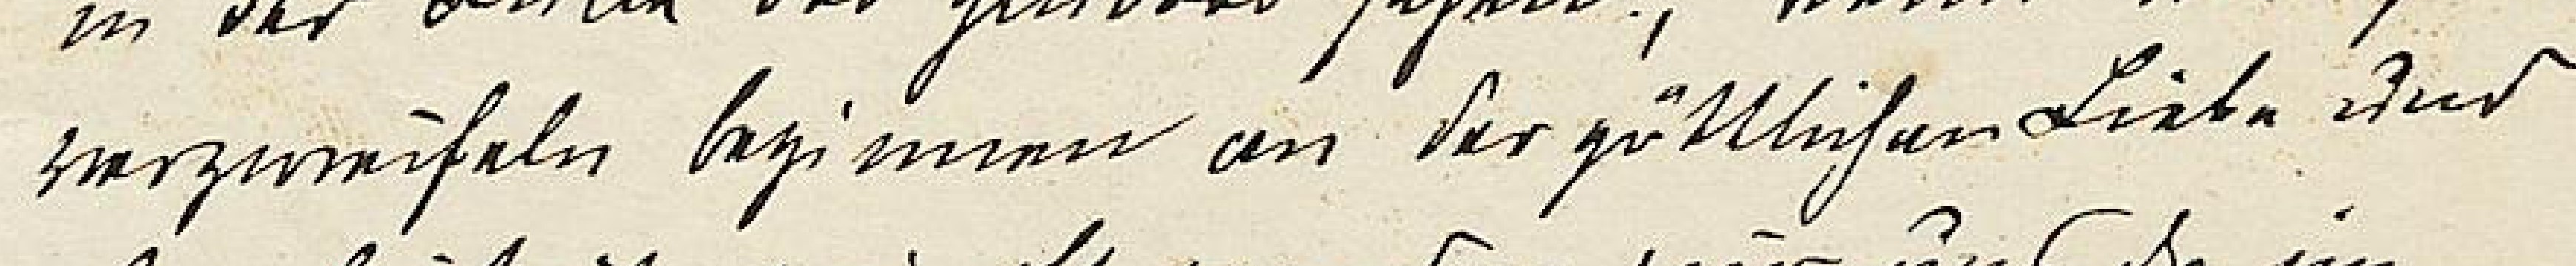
verzeifeln beginnen an der göttlichen Liebe und
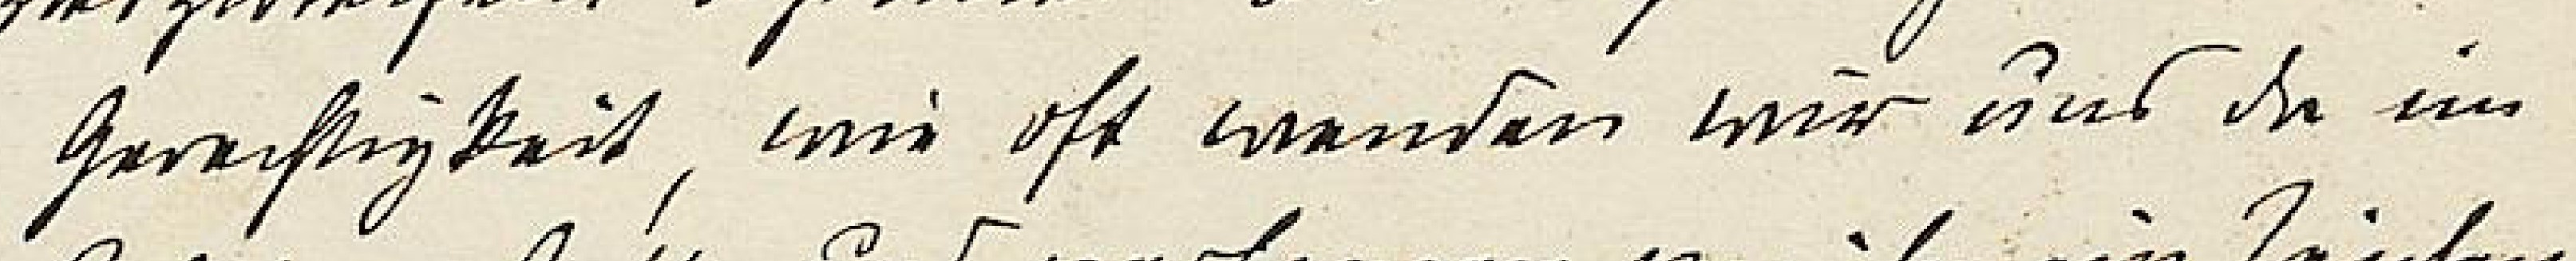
Gerechtigkeit, wie oft wenden wir uns da im
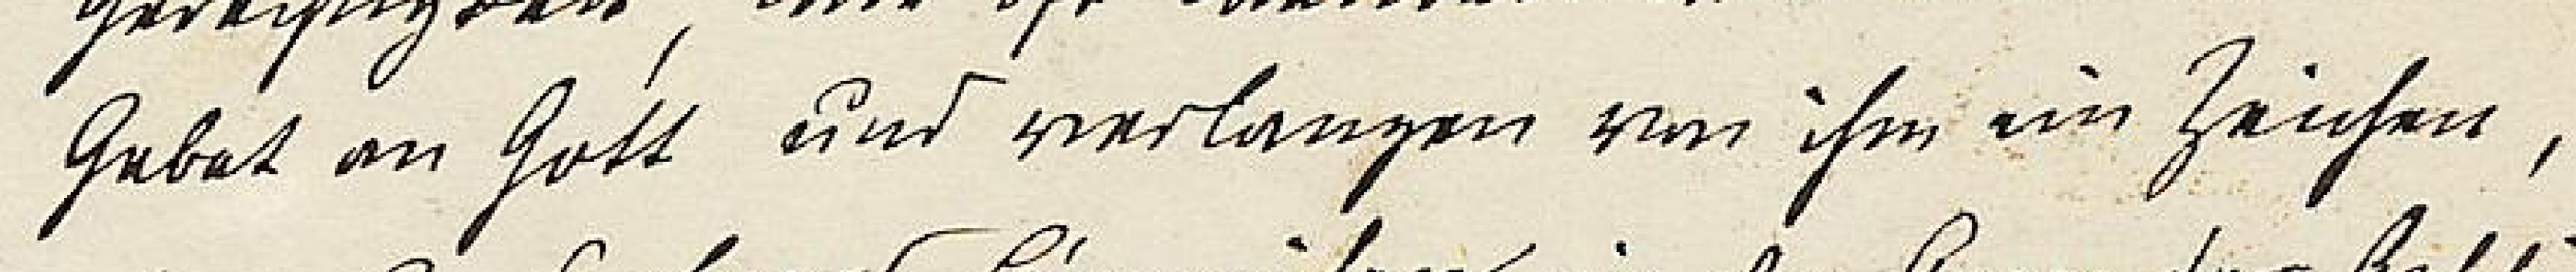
Gebet an Gott, und verlangen von ihm ein Zeichen
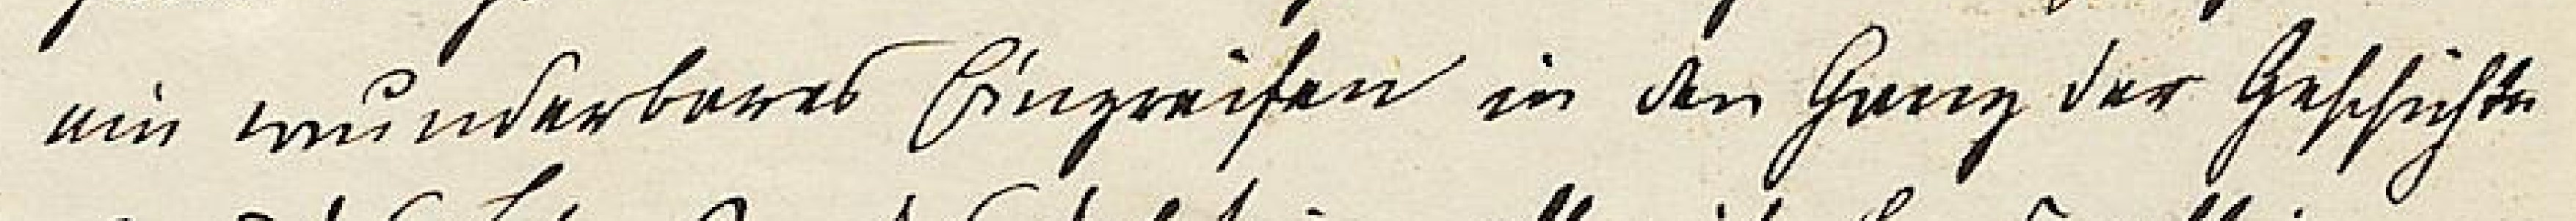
ein wunderbares Eingreifen an den Gang der Geschichte
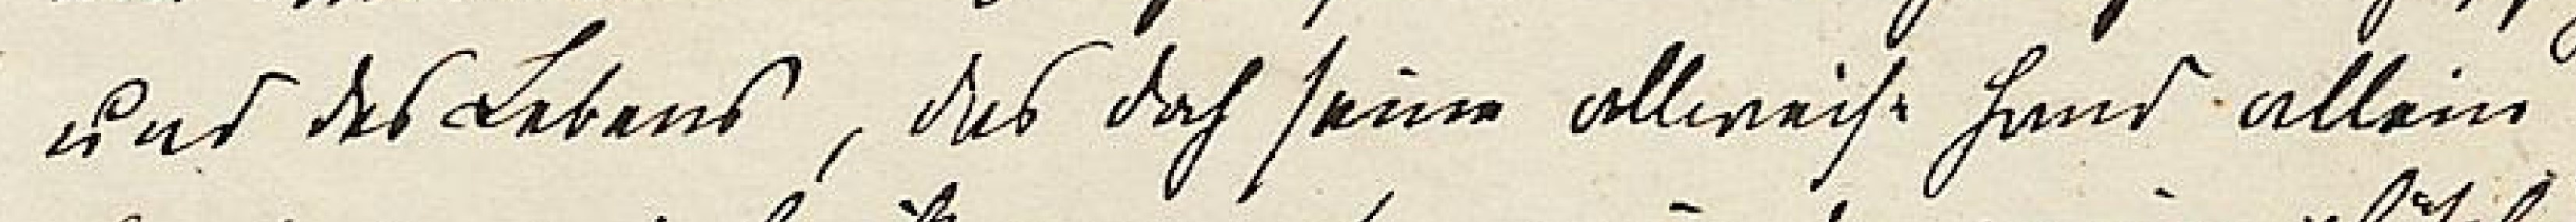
und das Lebens, das doch seine allweise Hand allein
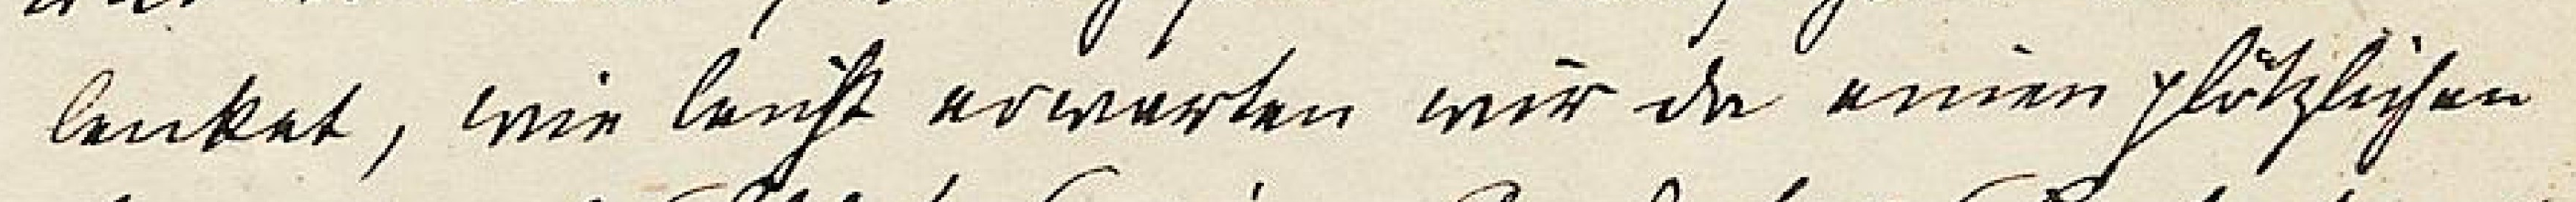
lenket, wie leicht erwarten wir da einen plötzlichen
